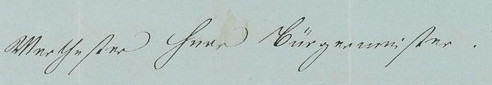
Werthester Herr Bürgermeister!
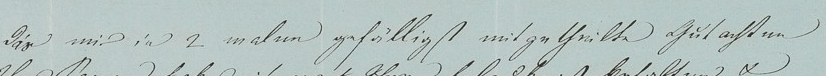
Das mir in 2 malen gefälligst mitgetheilte Gutachten
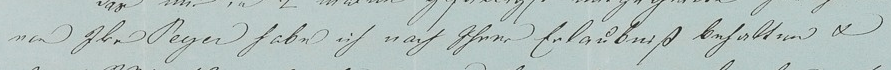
von Jkr Peyer habe ich nach Ihrer Erlaubniß behalten &
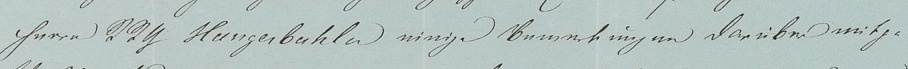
Herrn RRth Hungerbuhler einige Bemerkungen darüber mitge-
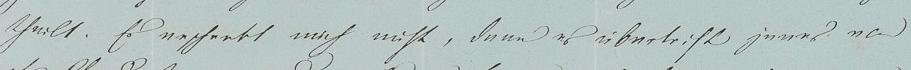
theilt. Es erschrekt mich nicht, denn es übertrift jenes von
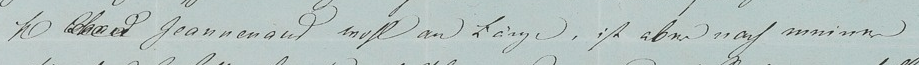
Herrn Chaud Jeanneraud wohl an Länge, ist aber nach meiner
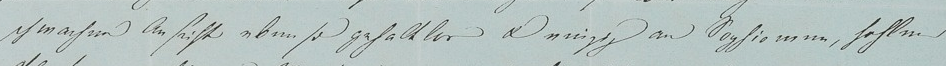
schwachen Ansicht ebenso gehalten & einzig an Sophismen, hohlen
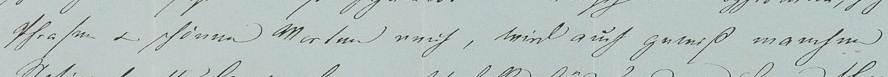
Phrasen & schönen Worten reich, wird auch gewiß manchen
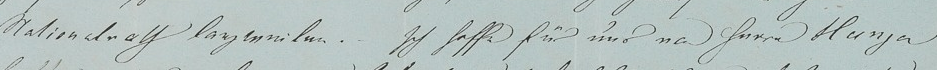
Nationalrath langweilen. Ich hoffe für uns von Herrn Hunger -
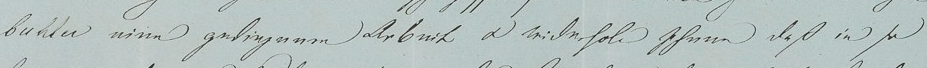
buhler eine gediegene Arbeit & widerhole Ihnen daß in so
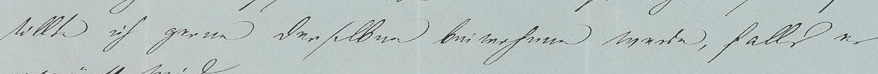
sollte ich gerne derselben beiwohnen werde, falls es
